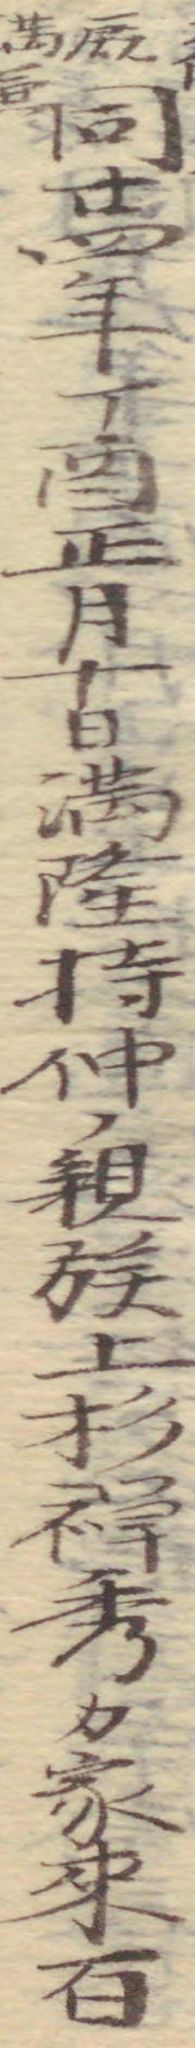同廿四年丁酉正月十日満隆持仲ノ親族上杉禅秀カ家来百
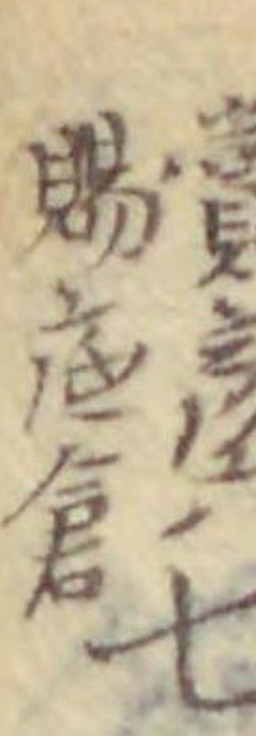賜底倉
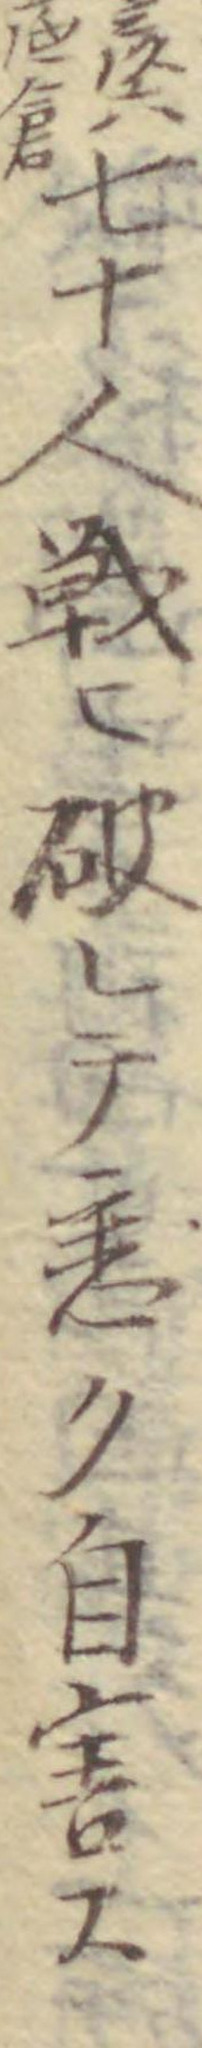七十人戦ヒ破レテ悉ク自害ス
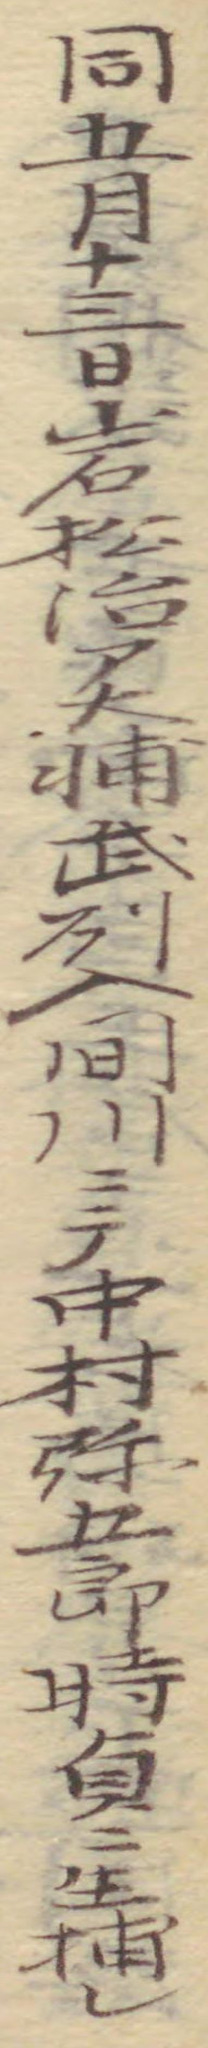同五月十三日岩松治部大輔武州入間川ニテ中村弥五郎時貞ニ生捕レ
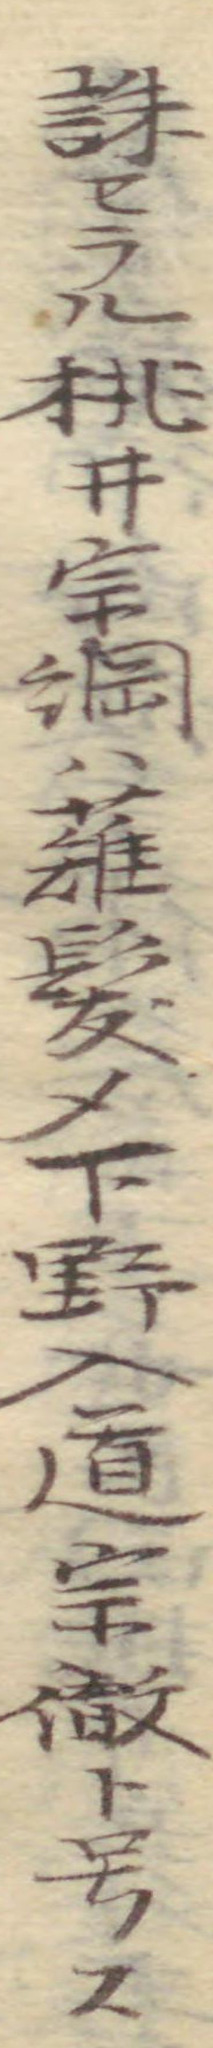誅セラル桃井宗綱ハ薙髪シテ下野入道宗徹ト号ス
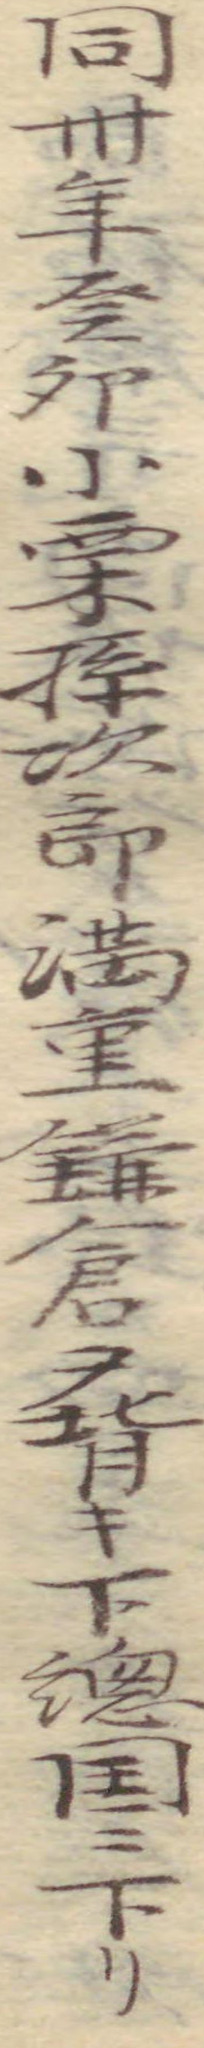同卅年癸卯小栗孫次郎満重鎌倉ヲ背キ下総国ニ下リ
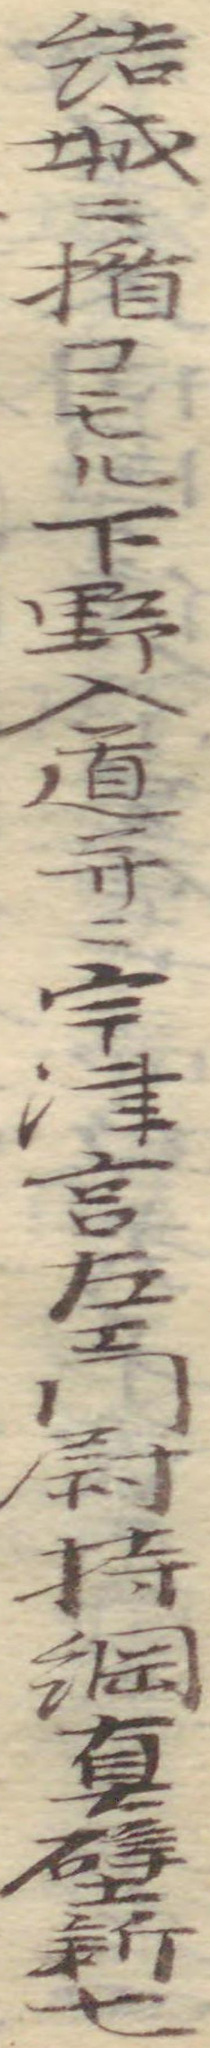結城ニ楯コモル下野入道幷ニ宇津宮左エ門尉持綱真壁新七
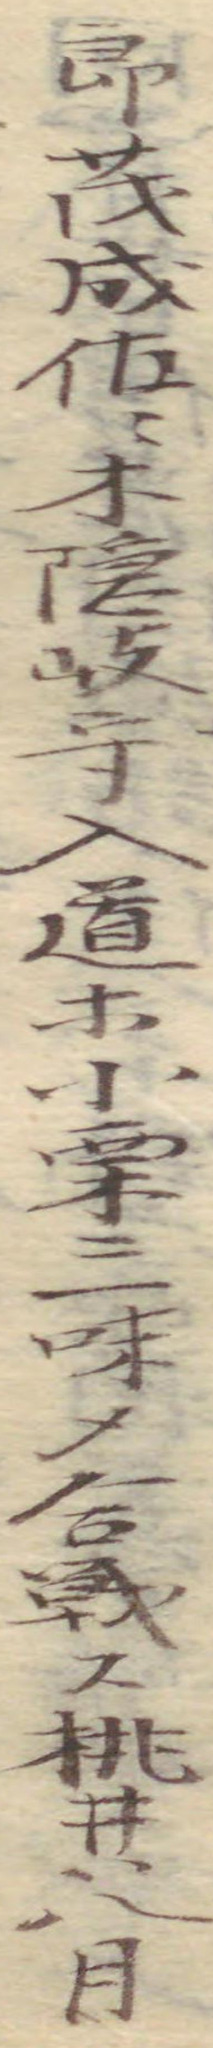郎茂成佐々木隠岐守入道等小栗ニ一味シテ合戦ス桃井ハ八月
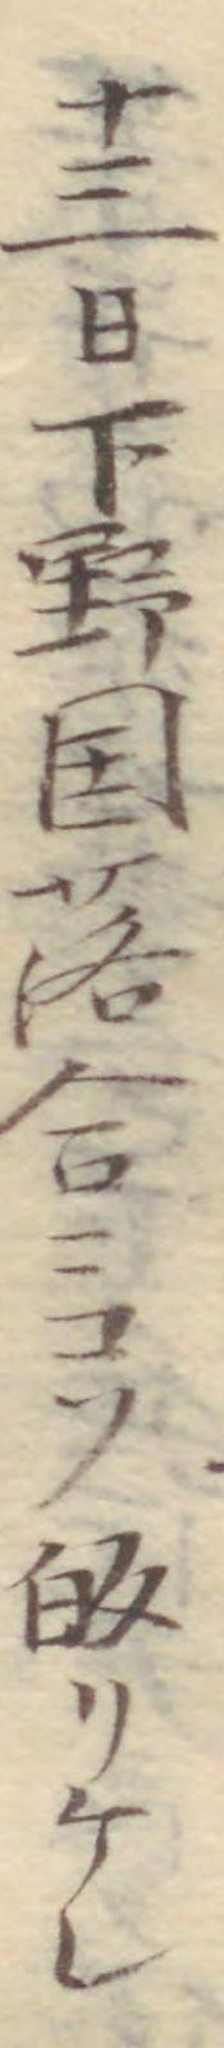十三日下野国落合ニコソ皈リケレ
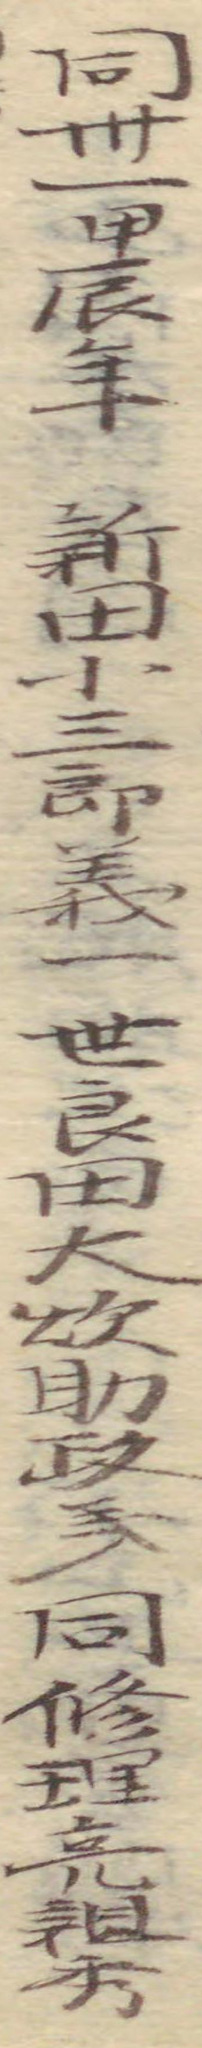同卅一甲辰年新田小三郎義一世良田大炊助政義同修理亮親秀
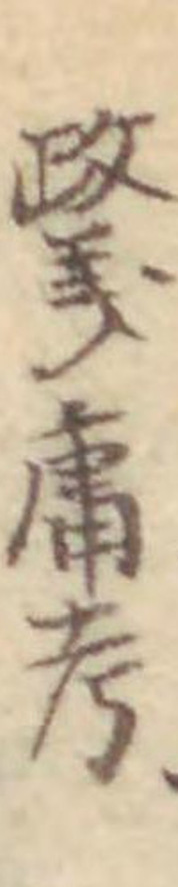政義庸考
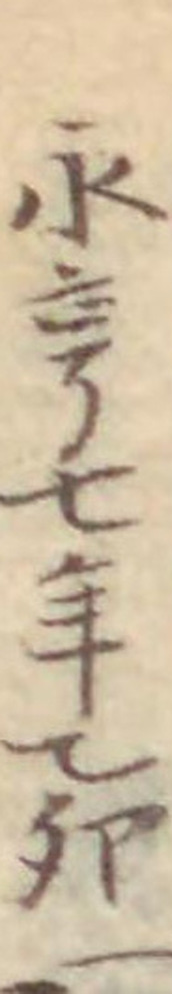永亨七年乙卯
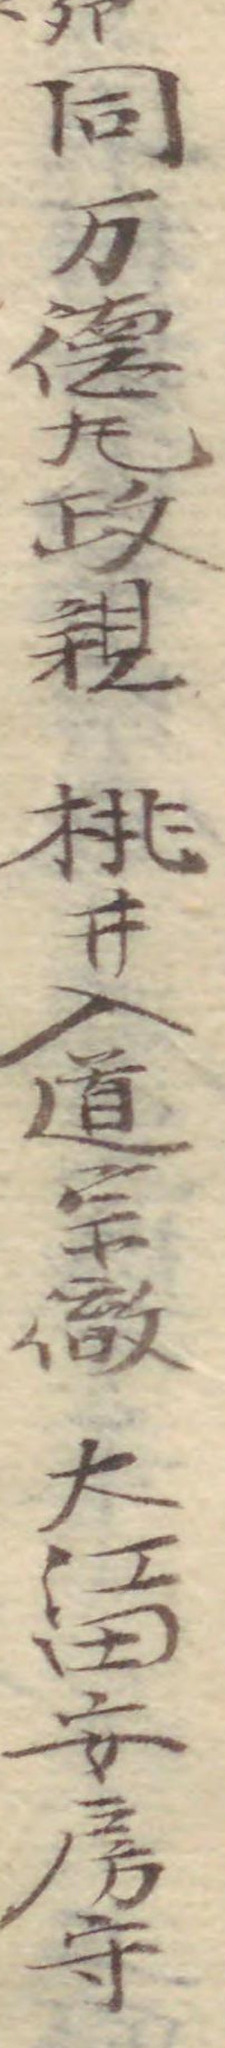同万徳丸政親桃井入道宗徹大江田安房守
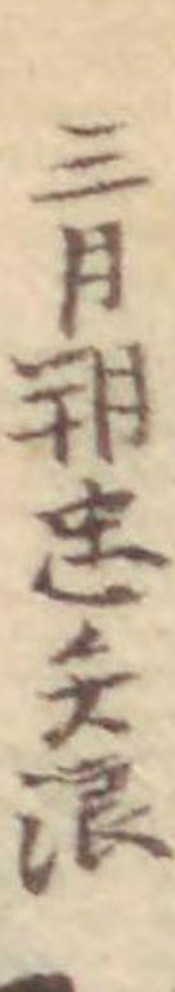三月朔忠矢浪
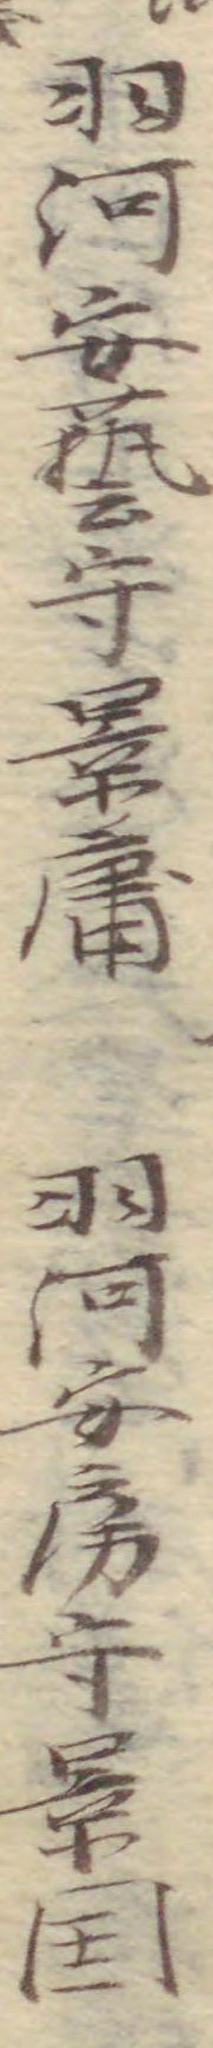羽河安芸守景庸羽河安房守景国
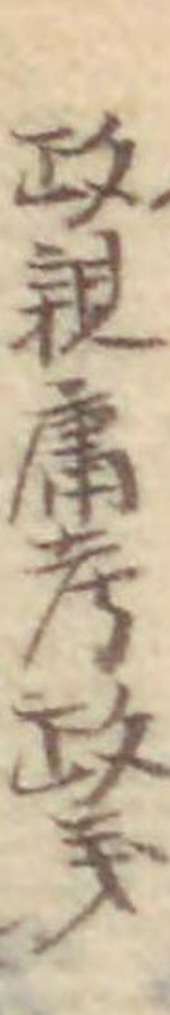政親庸考政義
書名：鶯宿雑記. 巻199-200
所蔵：国立国会図書館 National Diet Library, JAPAN
